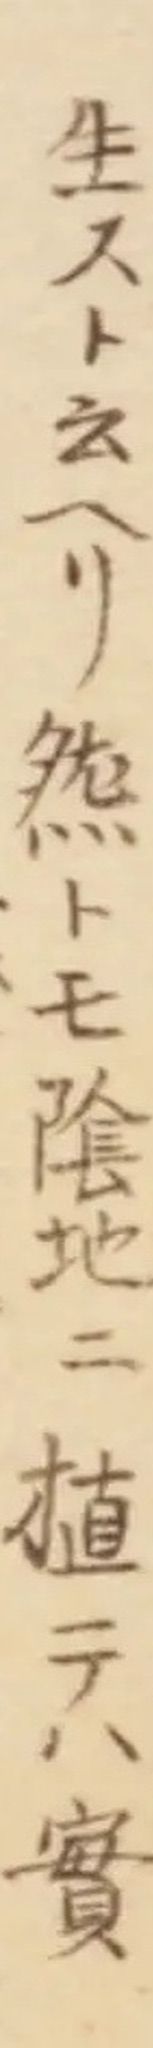生スト云ヘリ然トモ陰地ニ植テハ実
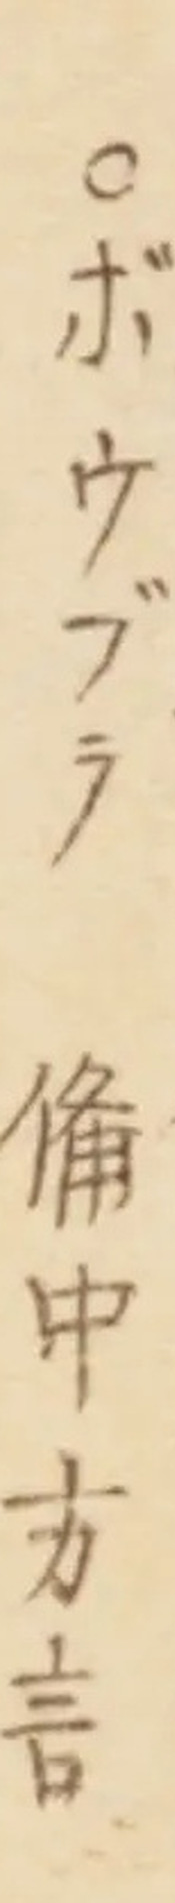○ボウブラ備中方言
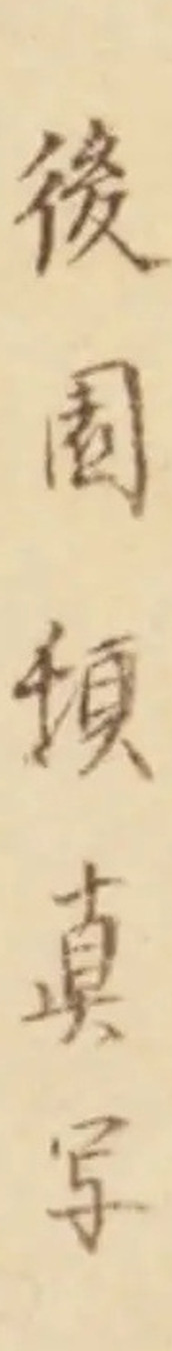後園頓真写
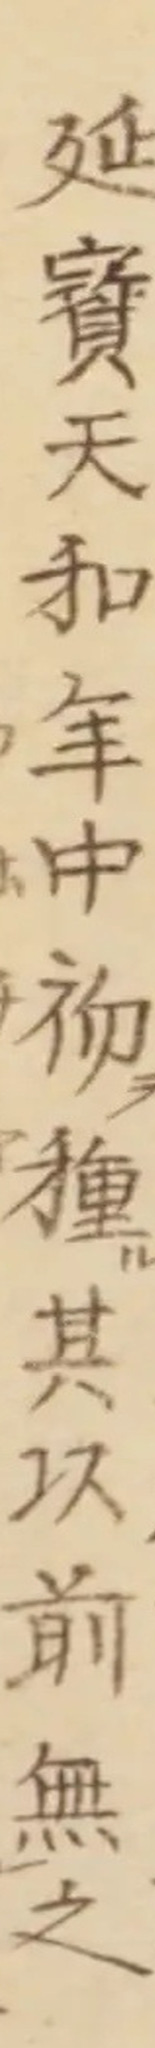延宝天和年中種其以前無之
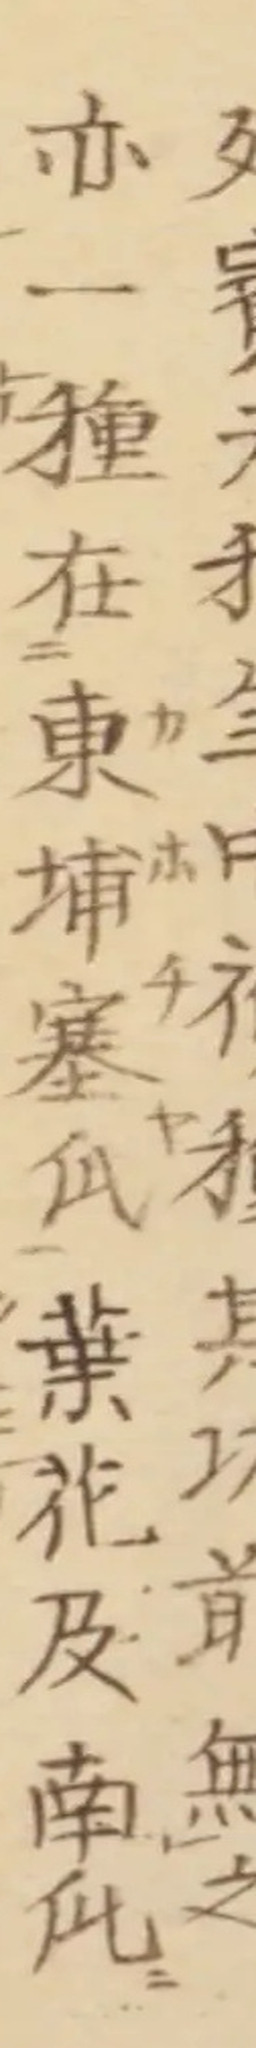亦一種在東埔塞瓜葉花及南瓜

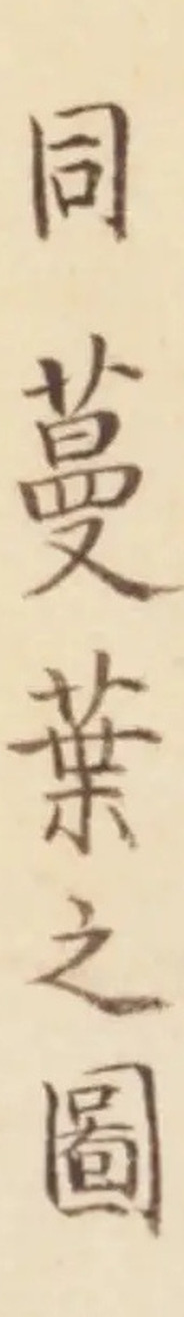同蔓葉之図

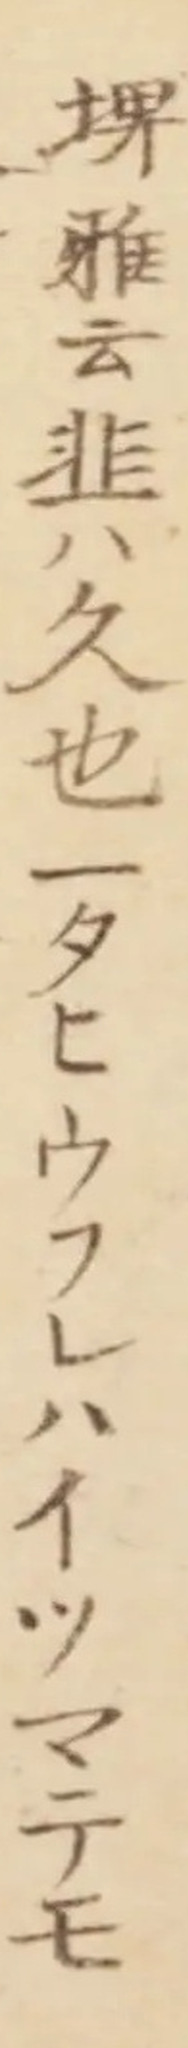韮埤雅云韭ハ久也一タヒウフレハイツマテモ
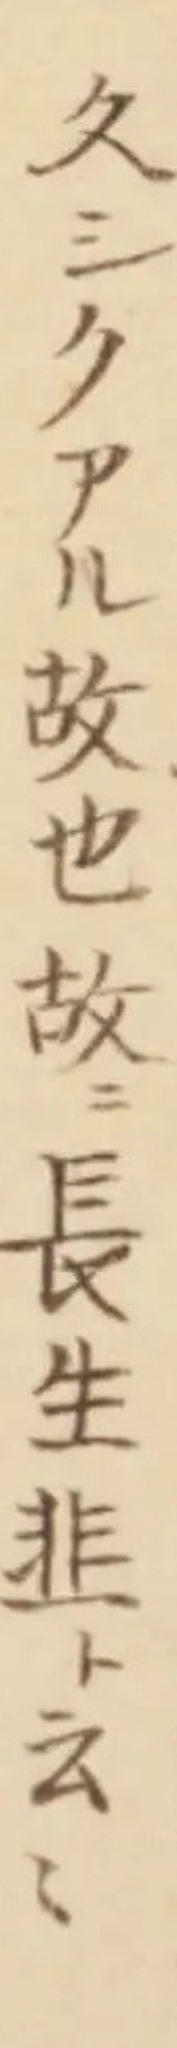久シクアル故也故長生韭云〻
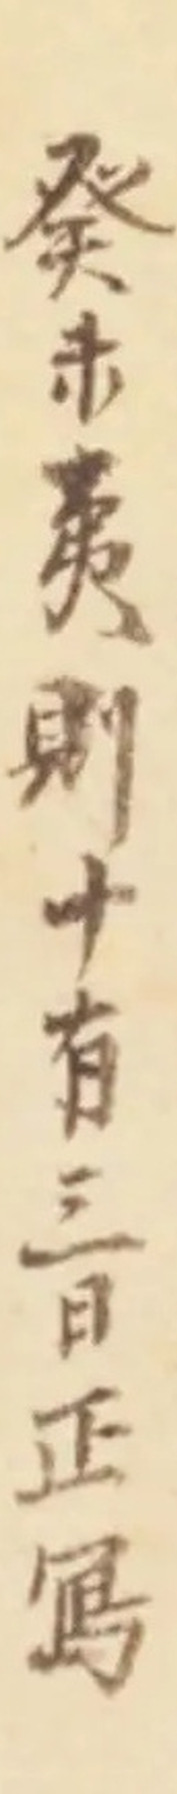癸未夷則十有三日正写
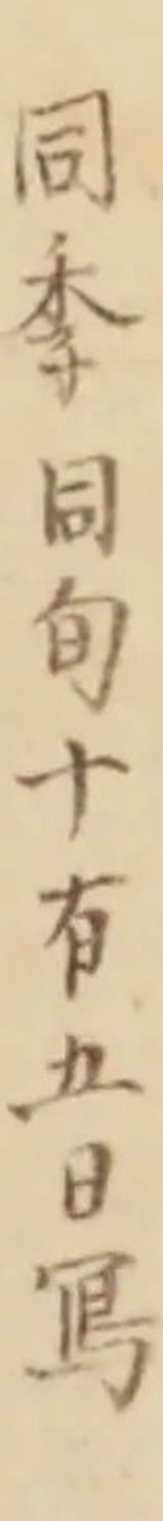同季同旬十有五日写

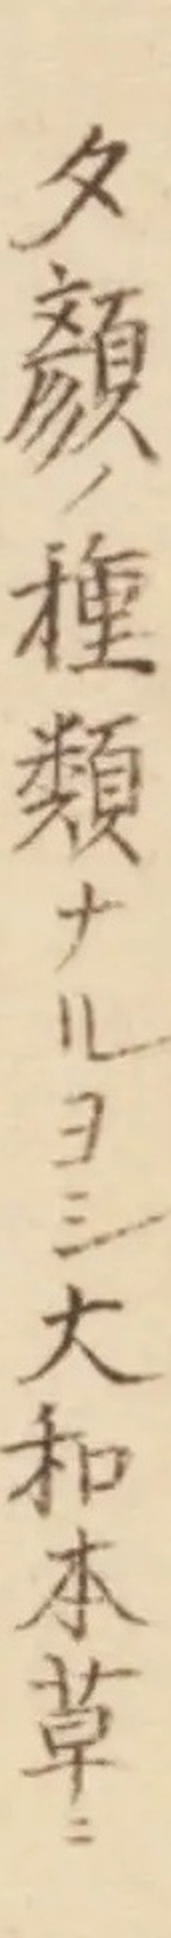夕顔ノ種類ナルヨシ大和本草
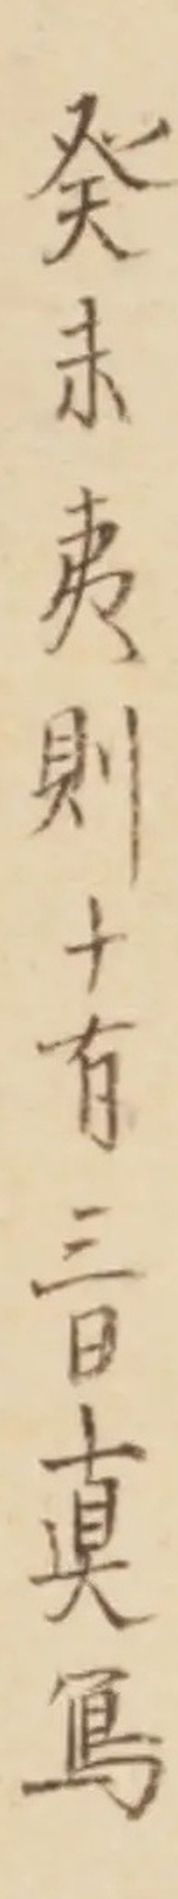癸未夷則十有三日真写

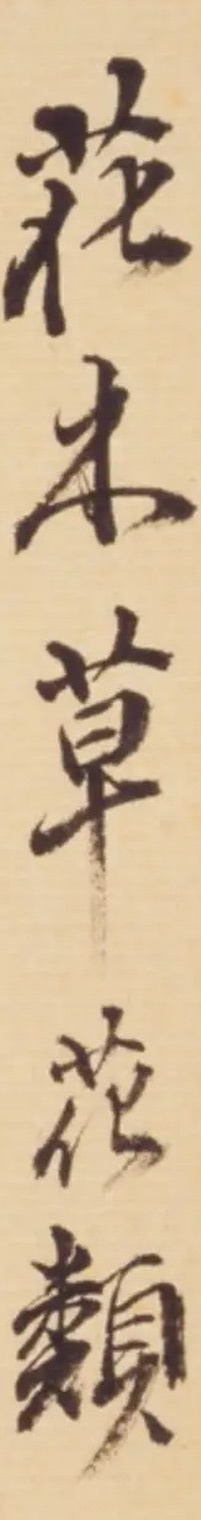花木草花類
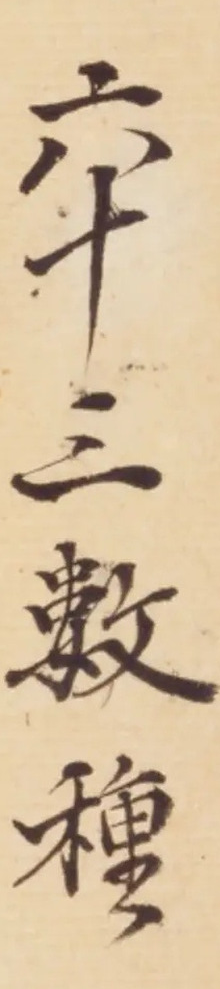六十三数種
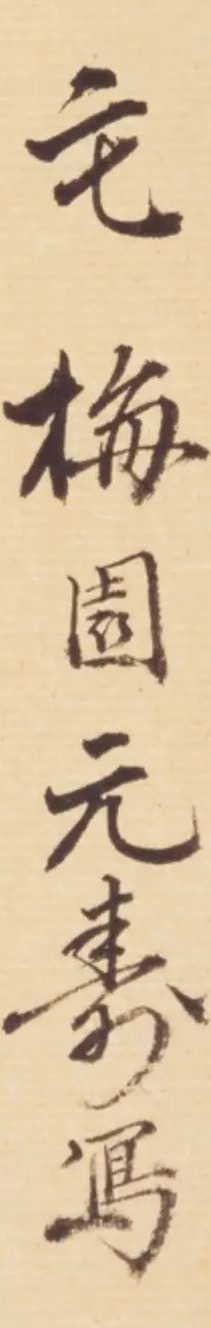毛梅園元寿写
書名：梅園草木花譜秋之部. 1
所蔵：国立国会図書館 National Diet Library, JAPAN
